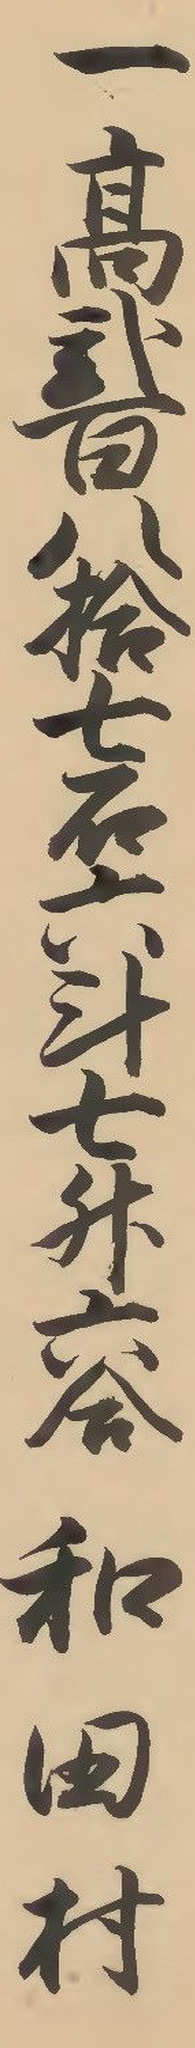一髙弐百八拾七石六斗七升六合和田村
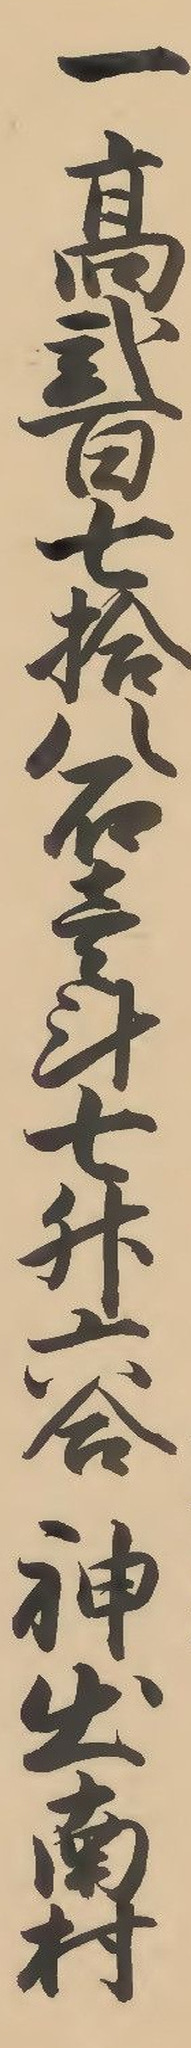一髙弐百七拾八石壱斗七升六合神出南村
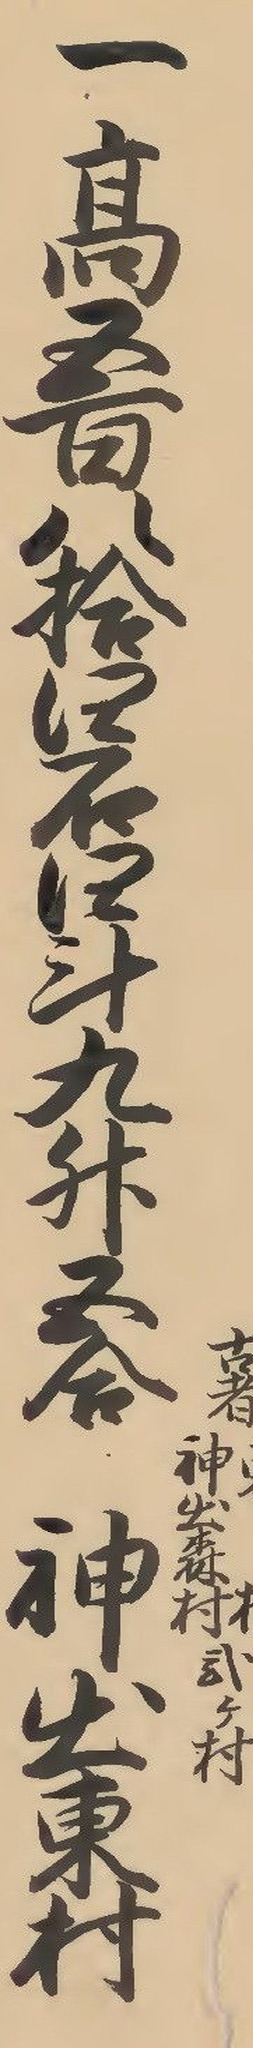一髙五百八拾四石四斗九升五合神出東村
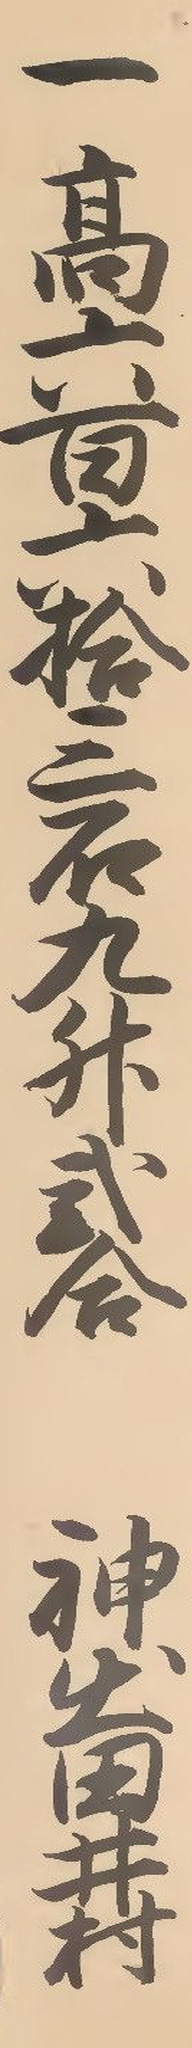一髙六百六拾三石九升弐合神出田井村
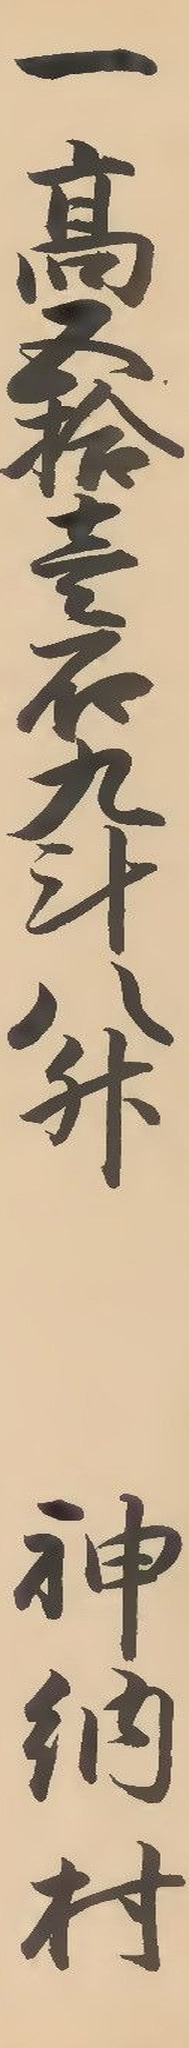一髙五拾壱石九斗八升神納村
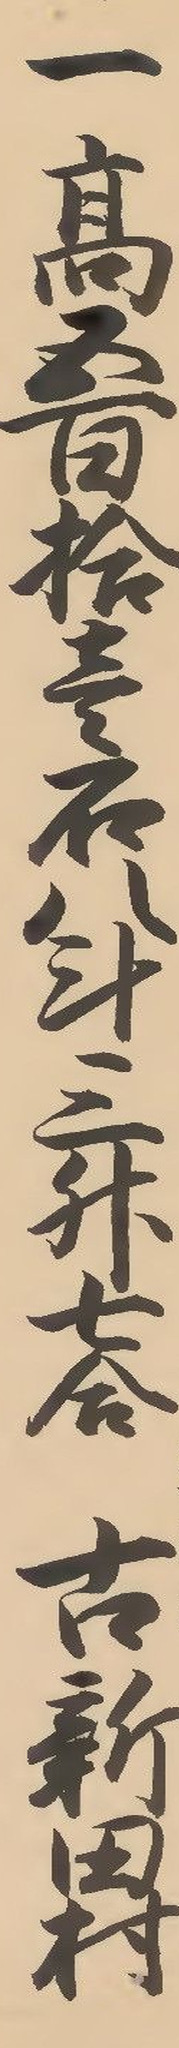一髙五百拾壱石八斗三升七合古新田村
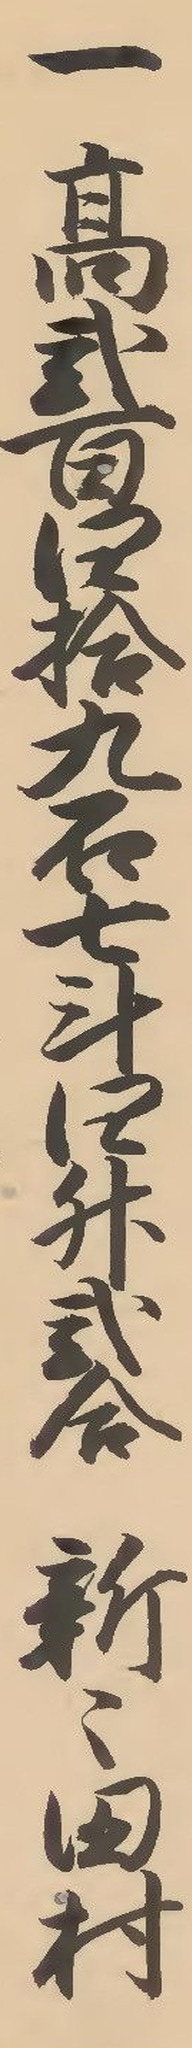一髙弐百四拾九石七斗四升弐合新々田村

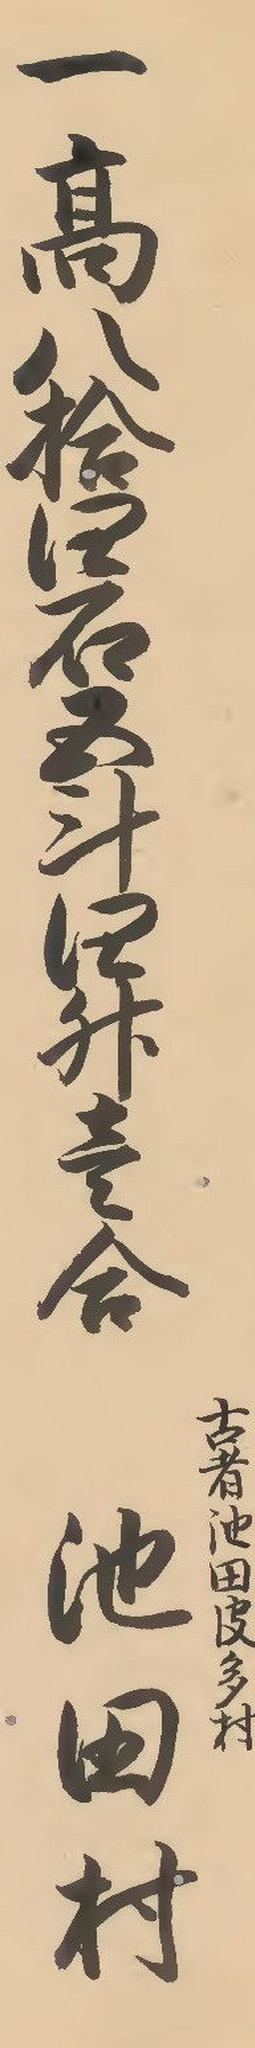一髙八拾四石五斗四升壱合池田村
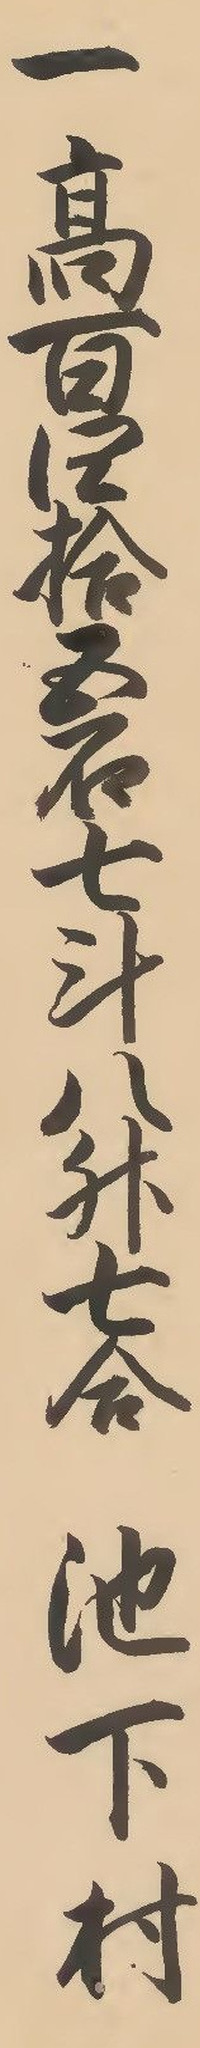一髙百四拾五石七斗八升七合池下村
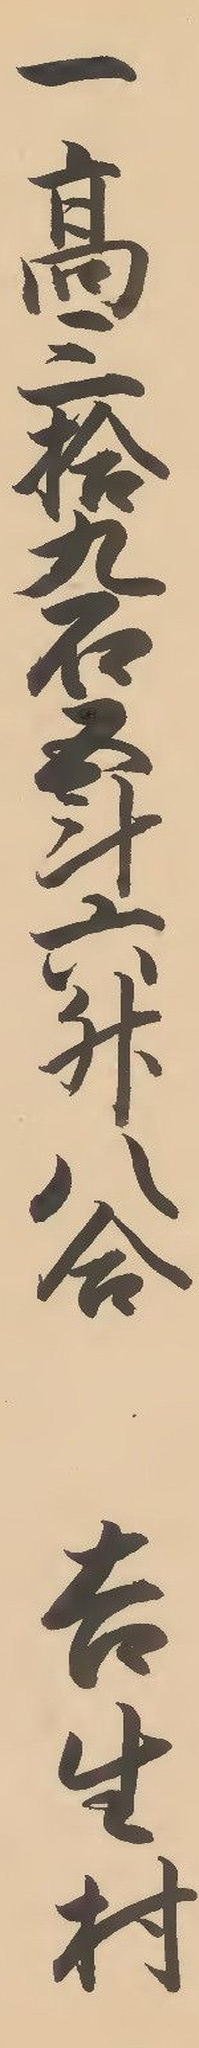一髙三拾九石五斗六升八合吉生村
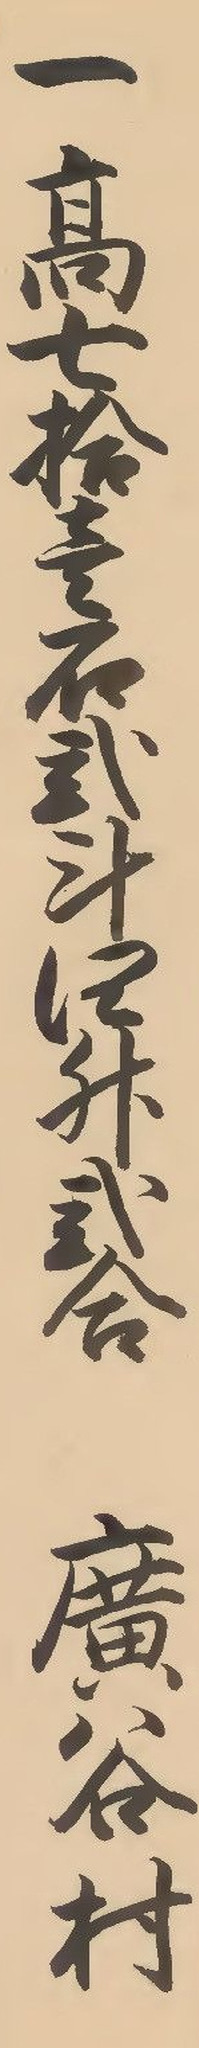一髙七拾壱石弐斗四升弐合廣谷村
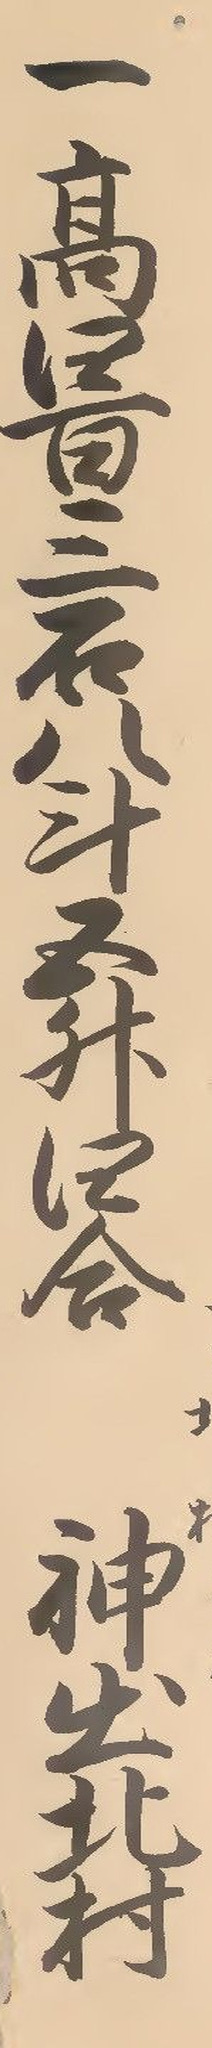一髙四百三石八斗五升四合神出北村
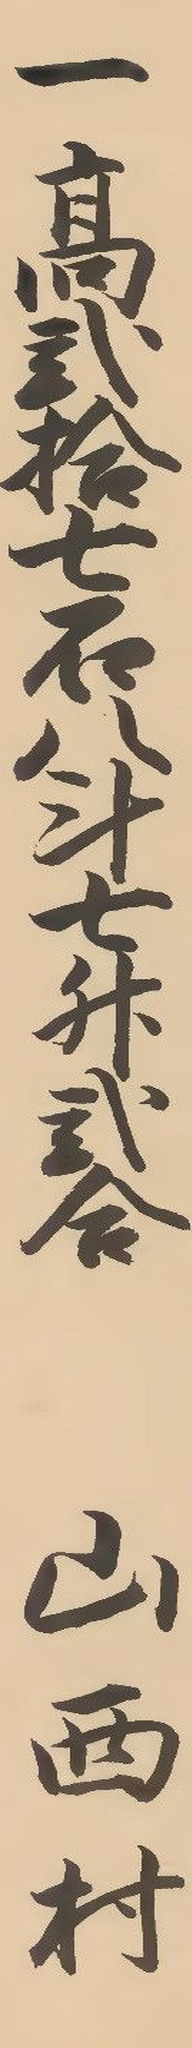一髙弐拾七石八斗七升弐合山西村
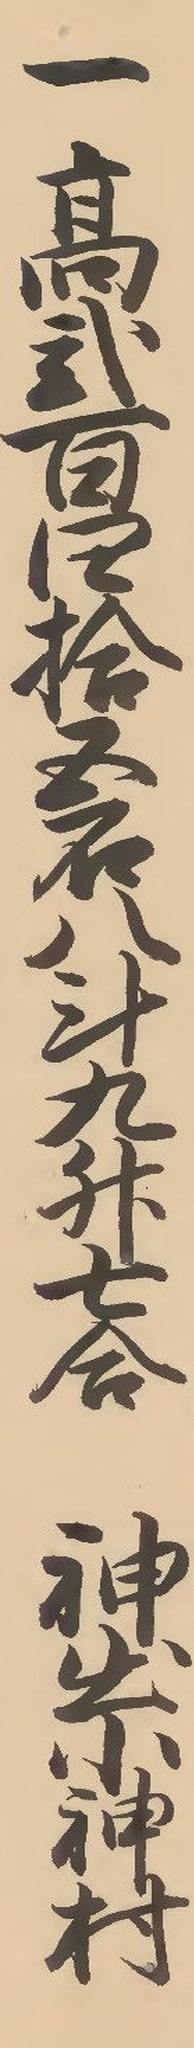一髙弐百四拾五石八斗九升七合神出小神村
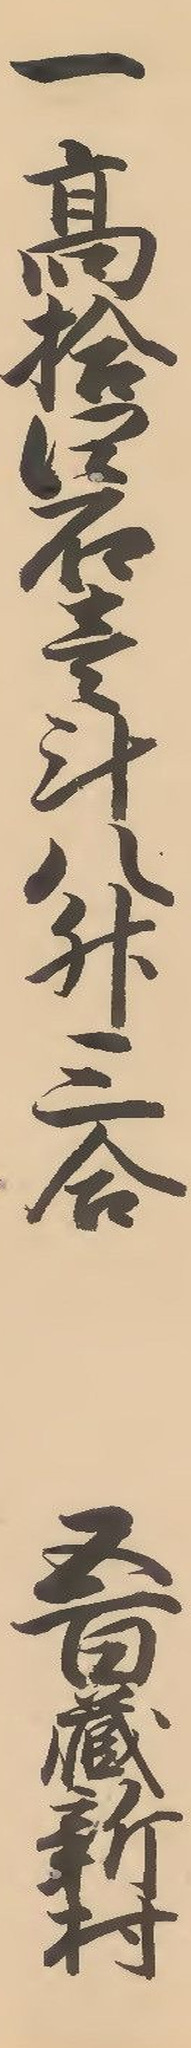一髙拾四石壱斗八升三合五百藏新村

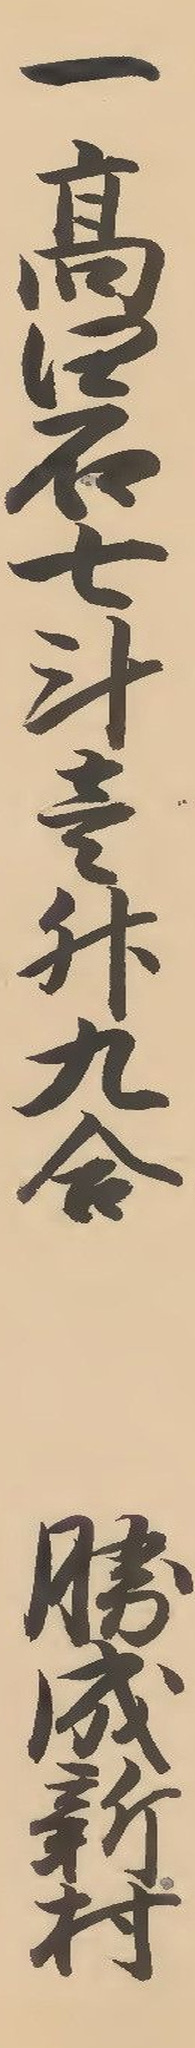一髙四石七斗壱升九合勝成新村
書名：播磨国郷帳
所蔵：国立公文書館 National Archives of Japan
